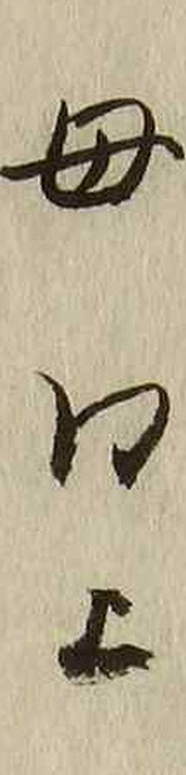母同上
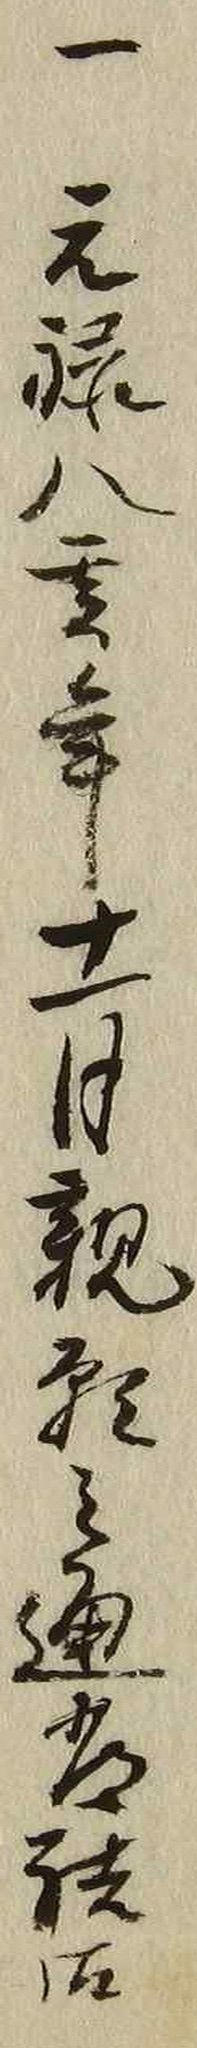一元禄八亥年十一月親願之通常詰御
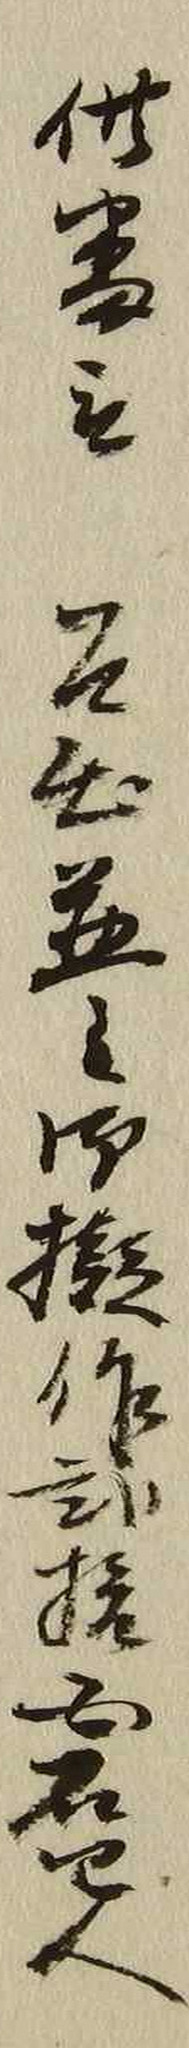供番被召出並之御擬作弐拾五石四人
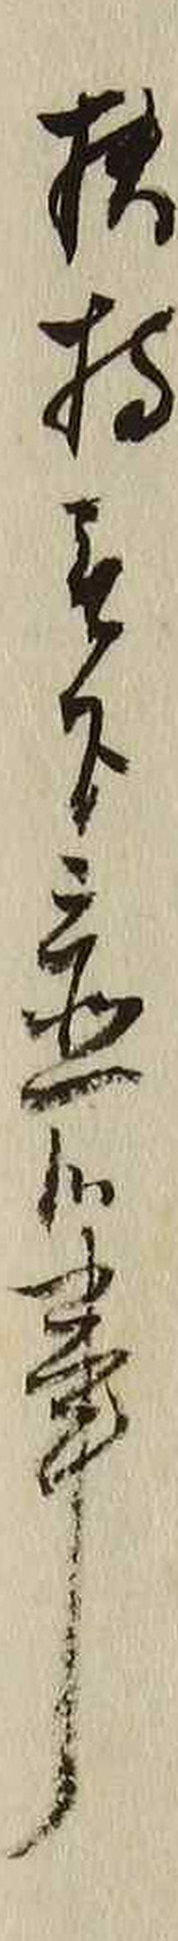扶持被下置候事
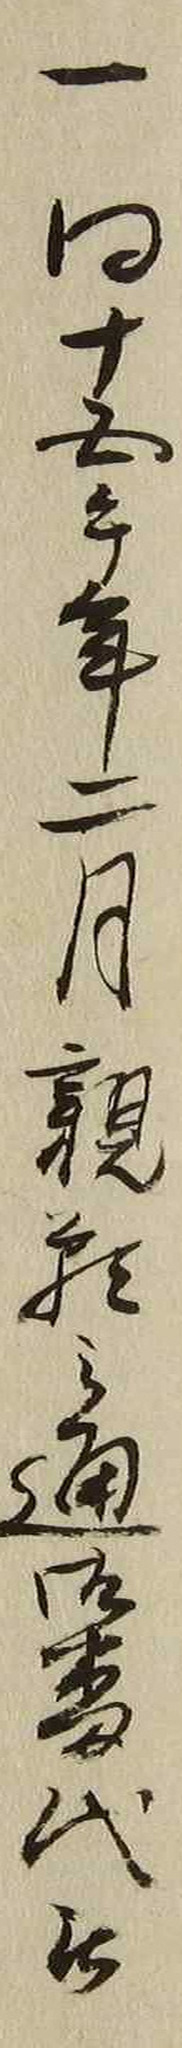一同十五午年二月親願之通御番代被
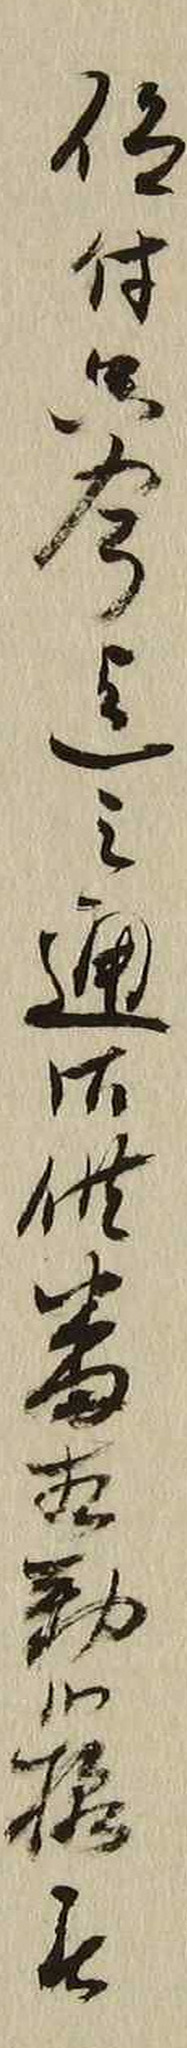仰付只今迄之通御供番相勤候様被
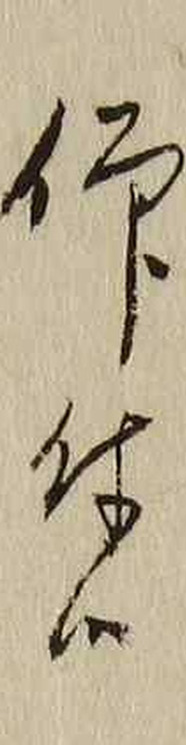仰付候
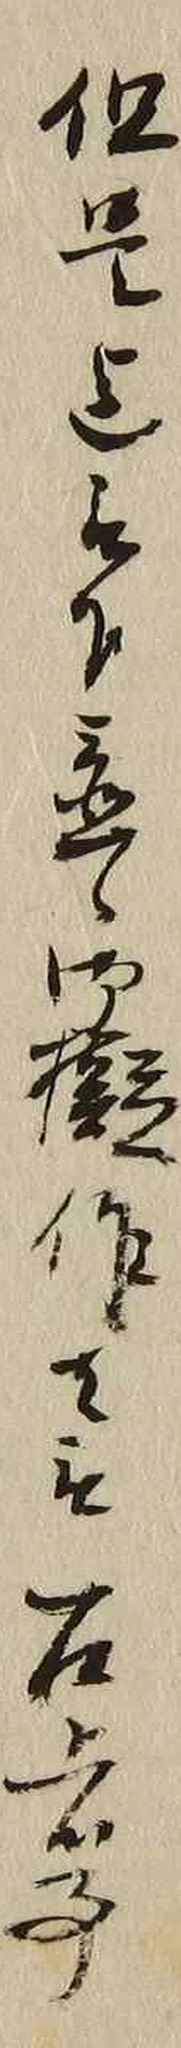但是迄被下置候御擬作者被召上候事
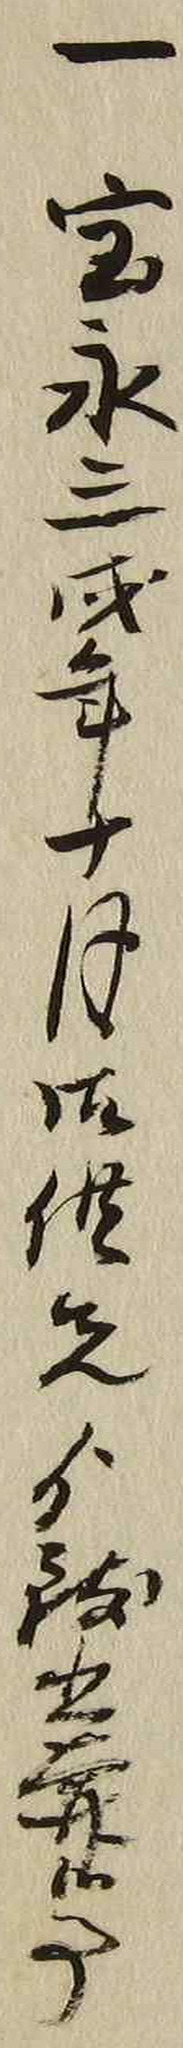一宝永三戌年十月御供先ゟ致出奔候事
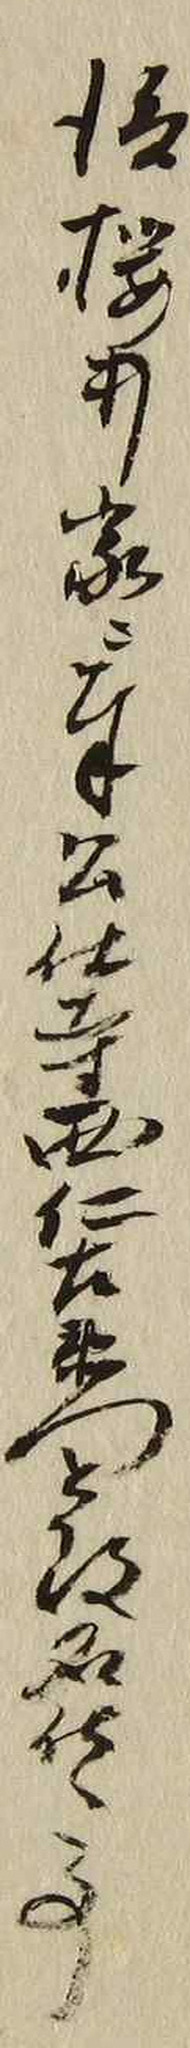後桜井家ニ奉公仕寺西仁左衛門と改名仕候事
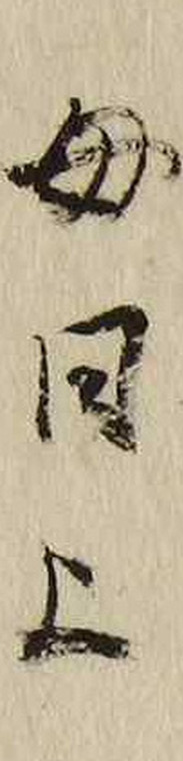母同上

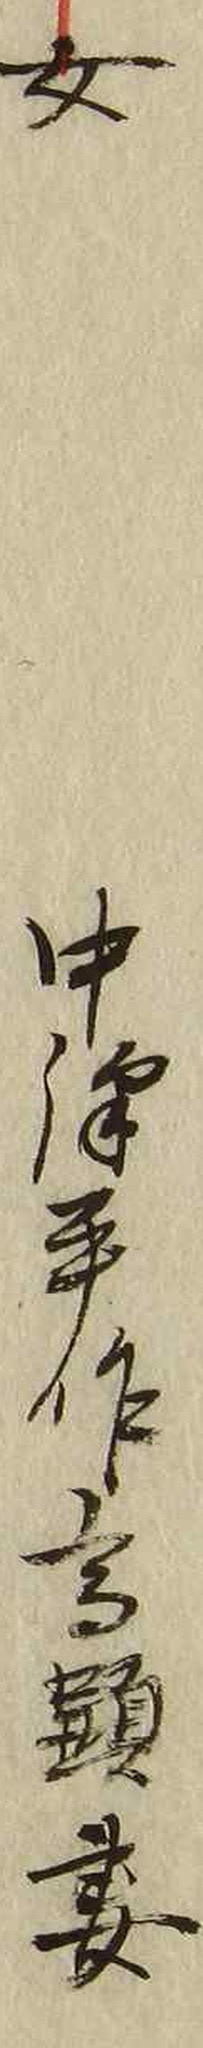女中沢平作高顕妻
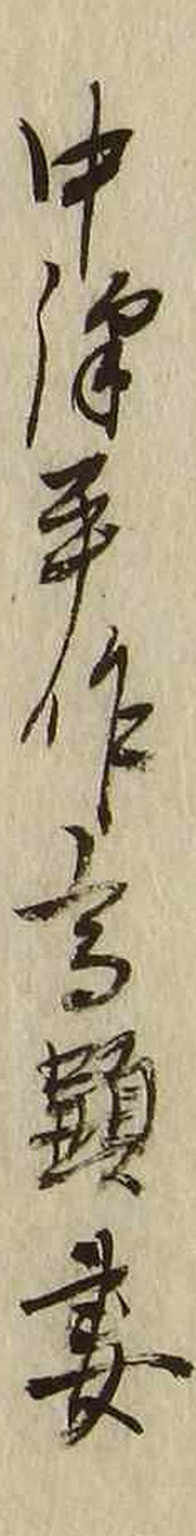女中沢平作高顕妻
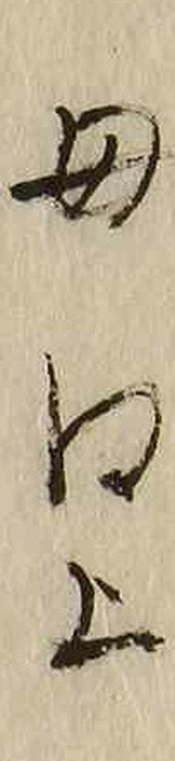母白上
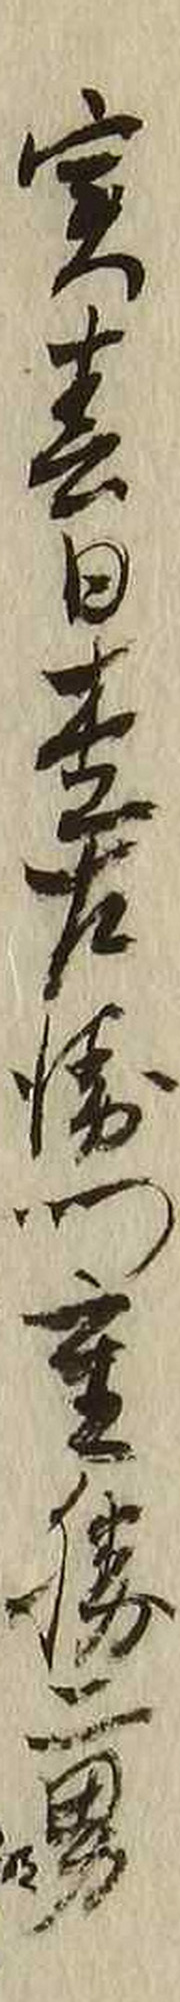実春日杢左衛門重勝二男
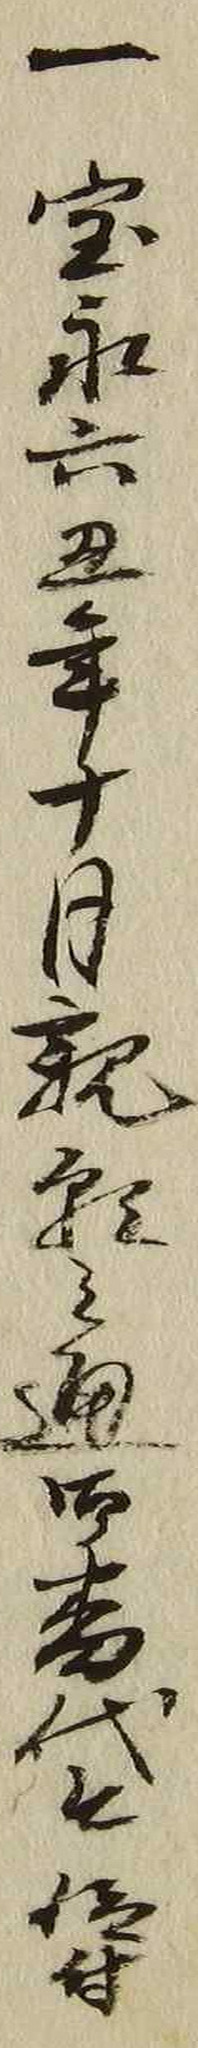一宝永六丑年十月親願之通御番代被仰付
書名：諸士系譜　巻之345　も之部1
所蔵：会津若松市立会津図書館
